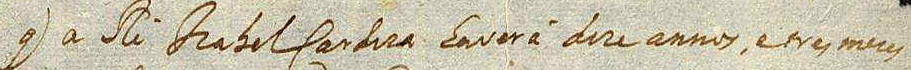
q̄ a Ré Izabel Cardoza haverá doze annos, e tres meses
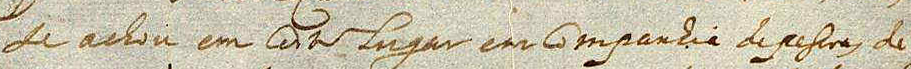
se achou em certo Lugar em companhia de pessoas de
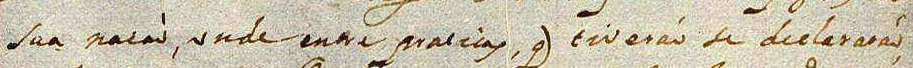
sua naçaõ, onde entre praticas, q̄ tiveraõ se declararaõ,
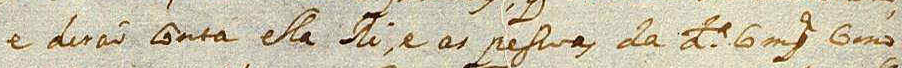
e deraõ conta ella Ré, e as pessoas da d̄a compa como
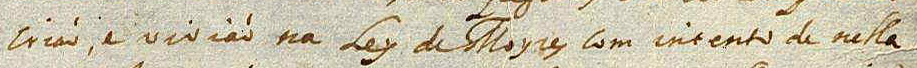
criaõ, e viviaõ na Ley de Moyzes com intento de nella
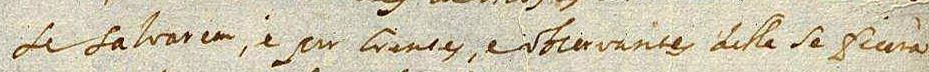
se salvarem, e por Crentes, e observantes della se ficaraõ
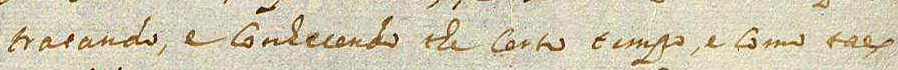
tratando, e conhecendo the certo tempo, e como taes
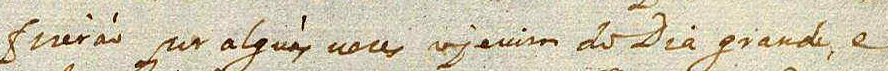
fizeraõ per alguās uezes o jeium do Dia grande, e
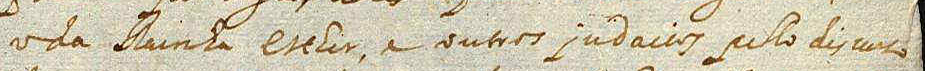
o da Rainha Esther, e outros judaicos pello discurso
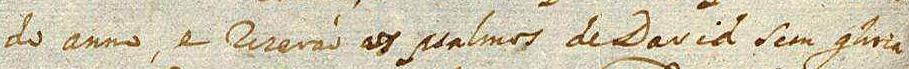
do anno, e Rezeraõ os psalmos de David sem gloria
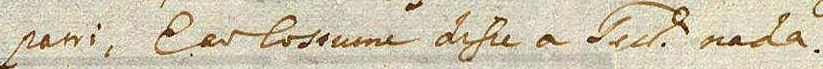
patri, E ao costume disse a Test.a nada.
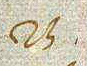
23.
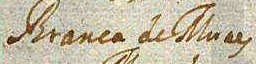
Branca de Moraes
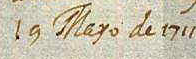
19 Mayo de 1711
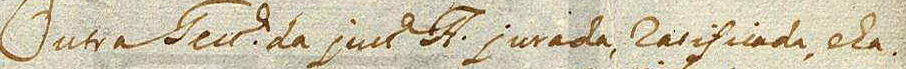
Outra Test.a da justa A. jurada, Ratificada, e ha
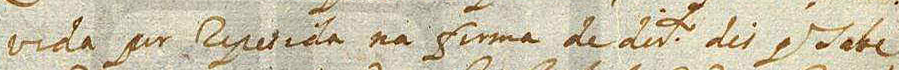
vida por Repetida na forma de dir.to dis q̄ sabe
